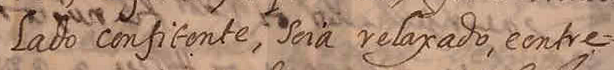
Lado confitente, seia relaxado, e entre
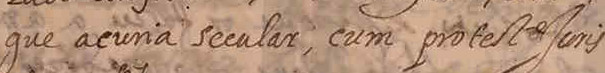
gue a curia secular, cum proteste Juris
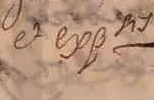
& expsis
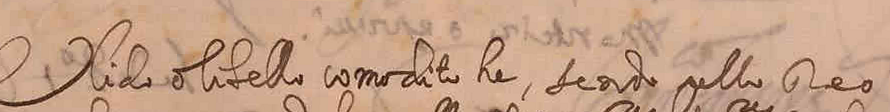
E lido o libello como dito he, sendo pello Reo
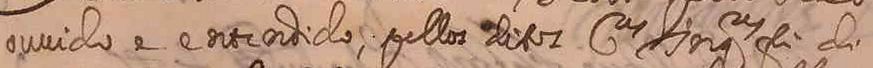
ouuido e entendido, pellos ditos sres Jnqres foi di
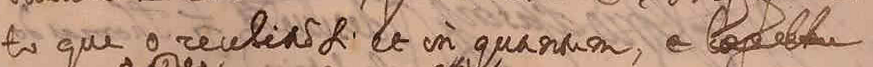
to que o reçebiaõ si et in quantum, e logo lhe
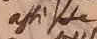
assiste
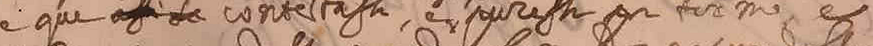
e que o Reo contestasse, e puzesse por termo, e
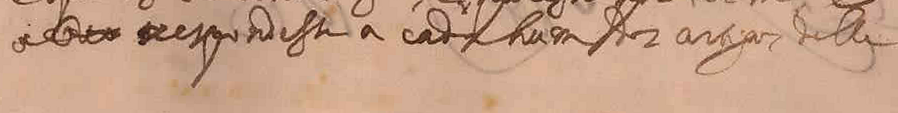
o Reo respondesse a cada hum os artigos delle
